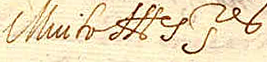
Muito Īlles Sres
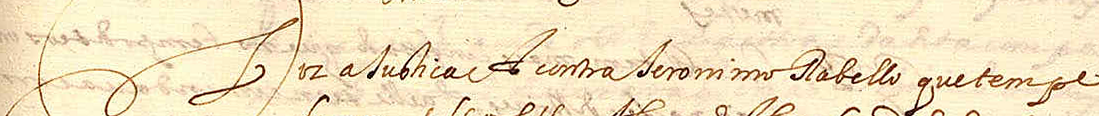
Diz a Iustica A contra Ieronimo Rabello que tem pe
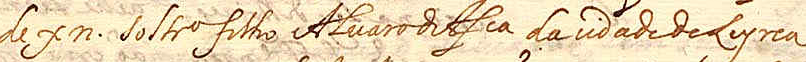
de x n. soltro filho Aluaro de Afca da cidade de Leyrea
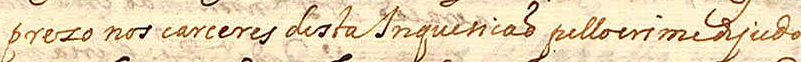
prezo nos carceres desta Inquesicaõ pello crime de juda
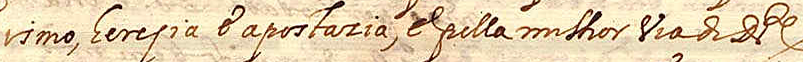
ismo, herejia E apostazia, E pella milhor Via de Drto
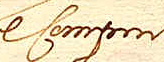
e Comprir
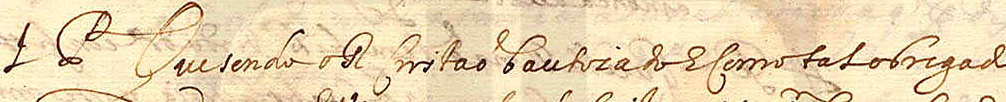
1 P Que sendo o R Cristaõ bautizado E Como tal obrigado
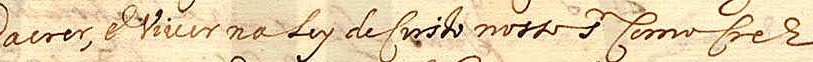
a crer, E Viuer na Ley de Cristo nosso sr Como Cre E
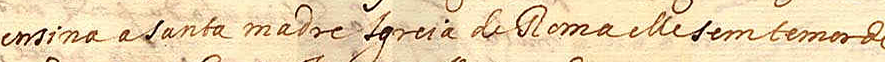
ensina a santa madre Igreia de Roma elle sem temor de
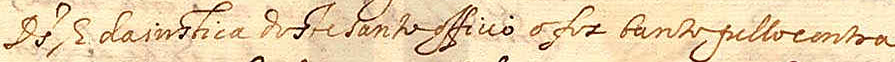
Ds̄, E da iustica deste santo officio o fez tanto pello contra
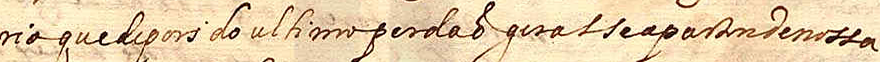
rio que depois do ultimo perdaõ geral se apartou de nossa
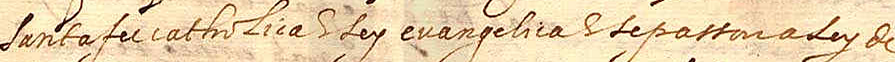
Santa fee catholica E Ley euangelica E se passou a Ley de
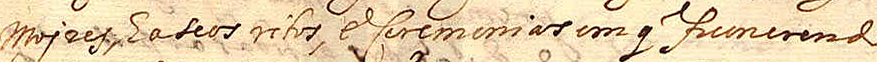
Mojzes, E a seos ritos, E Ceremonias em q̄ ficou crendo
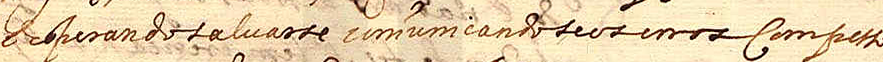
E esperando saluarse comūnicando seos erros Com pesso
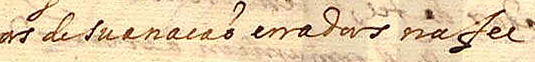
as de sua nacaõ errados na fee
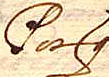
Por q̄
